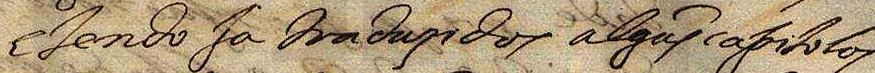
E tendo Ja traduzidos algus̄ capitolos
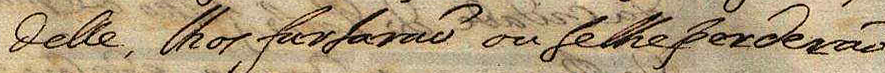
delle, lhos furtaraõ ou se lhe perderaõ
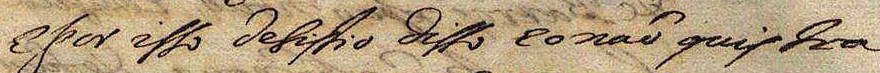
E por isso desistio disso E o naõ quis tra
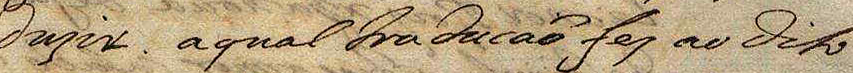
duzir. a qual traducaõ fez ao dito
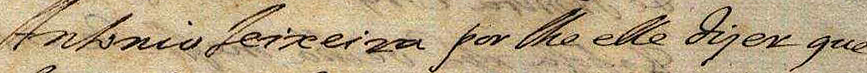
Antonio teixeira por lhe elle dizer que
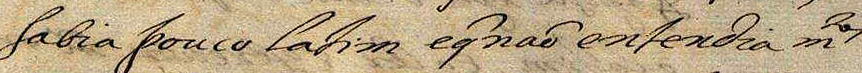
Sabia pouco Latim e q̄ naõ entendia mtos
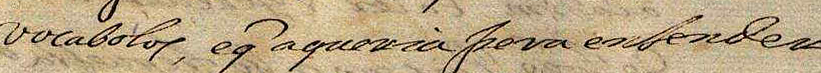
vocabolos, e q̄ a queria pera entender
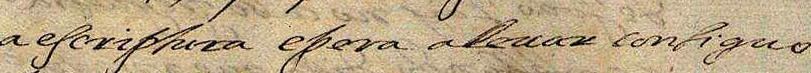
a escriptura e pera a leuar consiguo
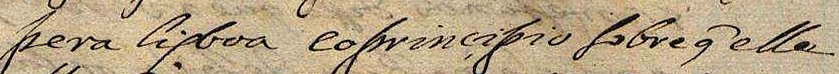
pera lisboa e o prinçipio sobre q̄ elle
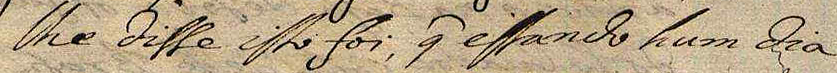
lhe disse isso foi, q̄ estando hum dia
